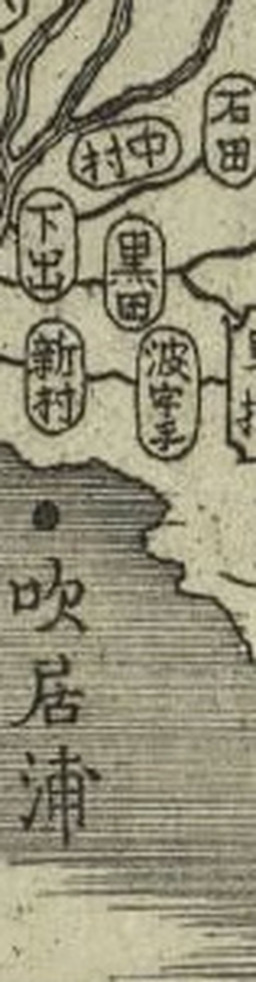●吹居浦
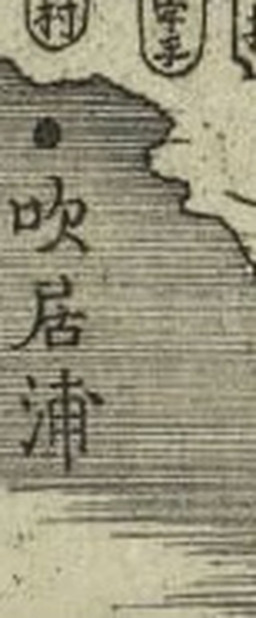●吹居浦
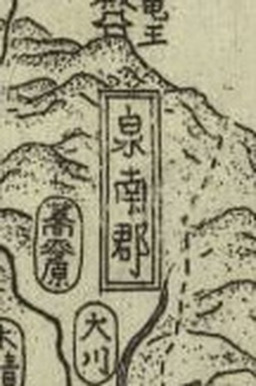泉南郡
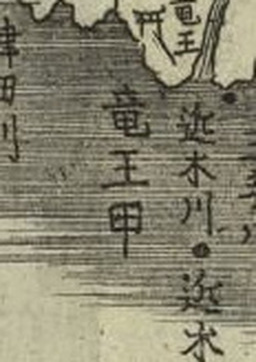竜王甲
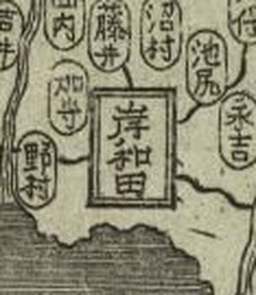岸和田
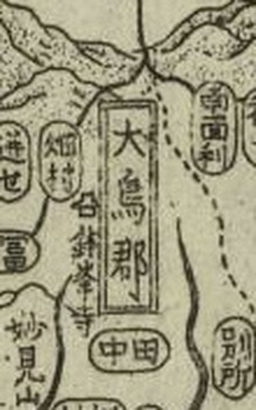大鳥郡
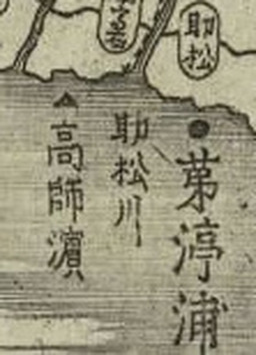助松川

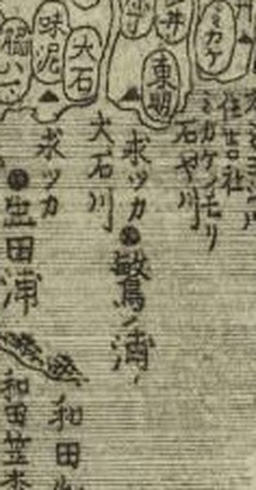大和川
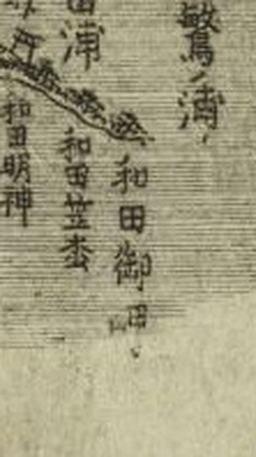和田御岬
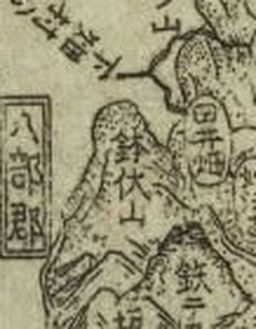鉢伏山

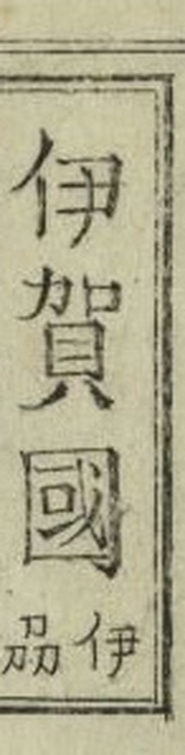伊賀郡
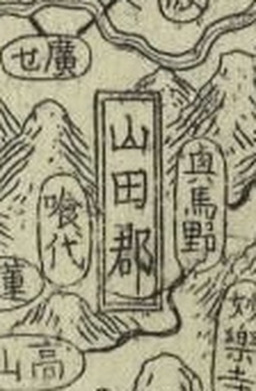山田郡
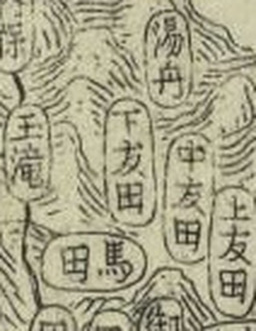下友生
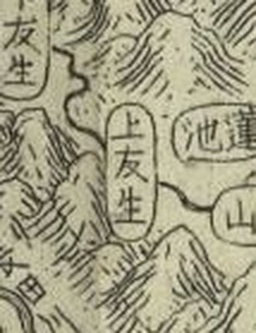下友生
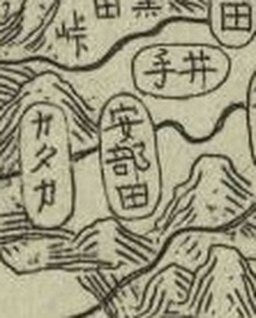安部郡

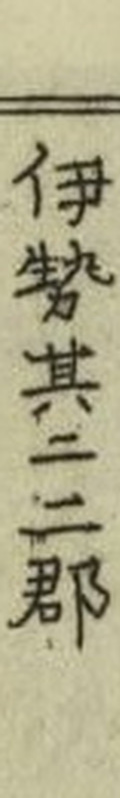伊勢其二二郡
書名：大日本国細図 東国之部 上
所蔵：University of the Ryukyus Library
